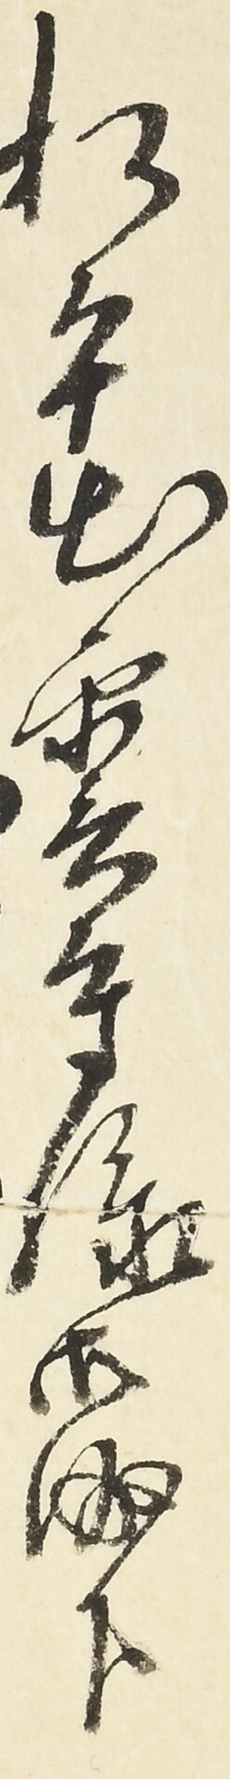松平出雲守様御城下
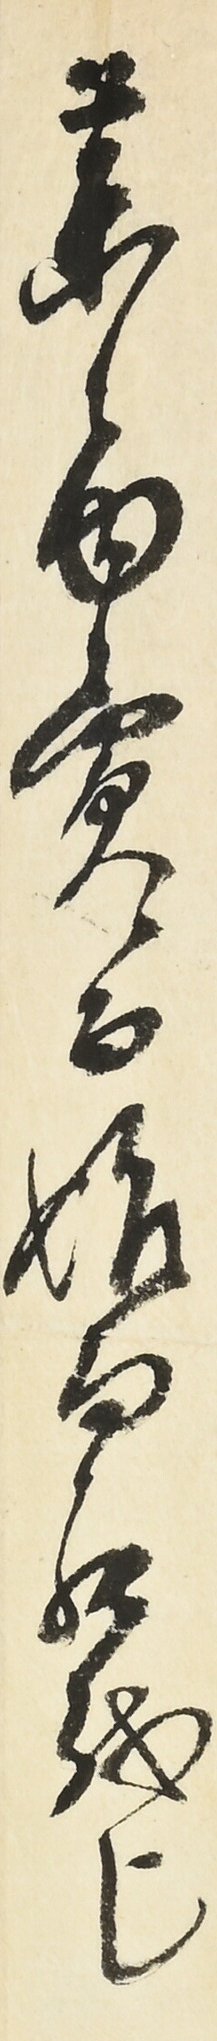薬商売ニ而始而罷越申候
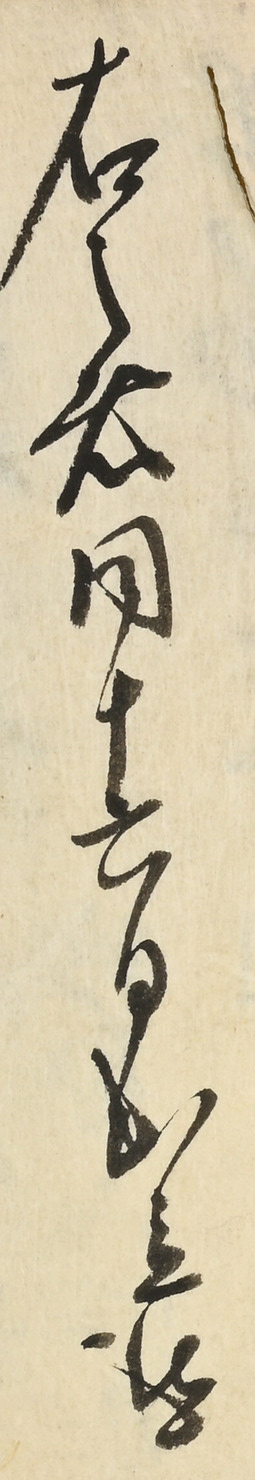右之者同六日出立仕候

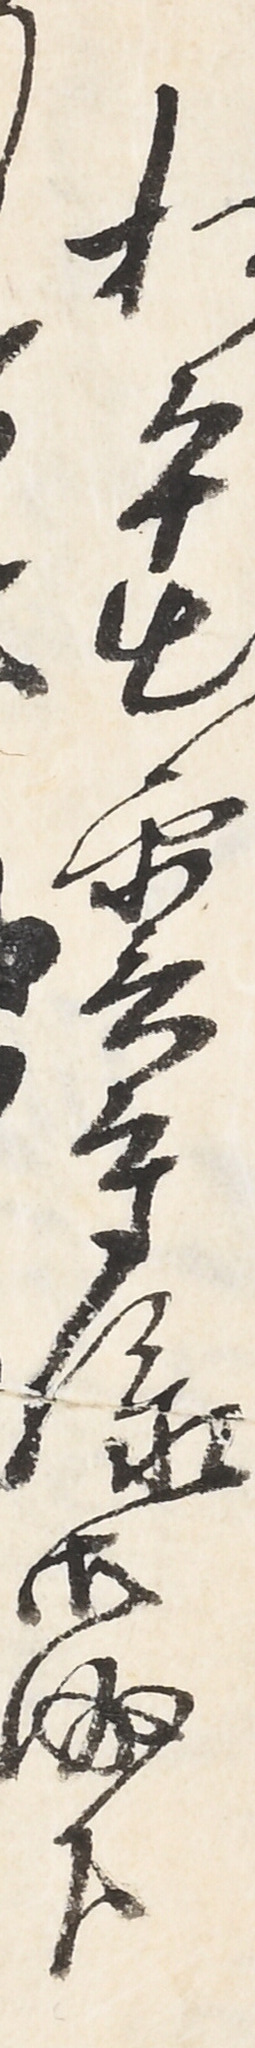松平出雲守様御城下
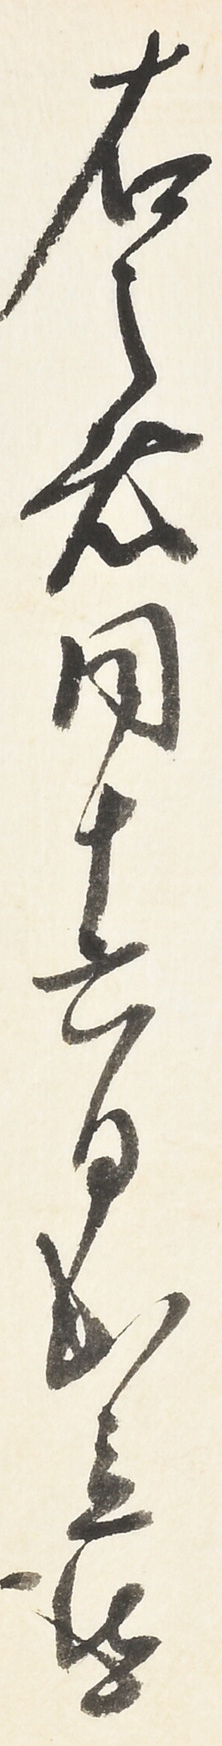右之者同十六日出立仕候
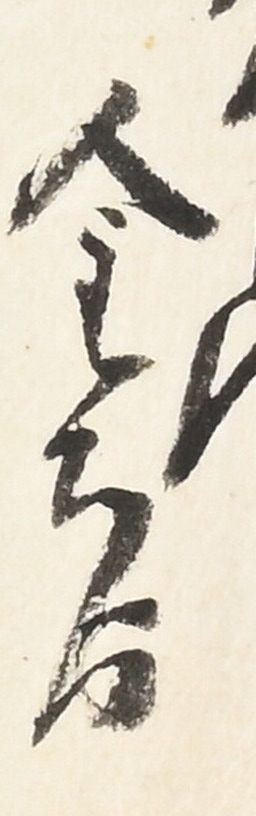金右衛門
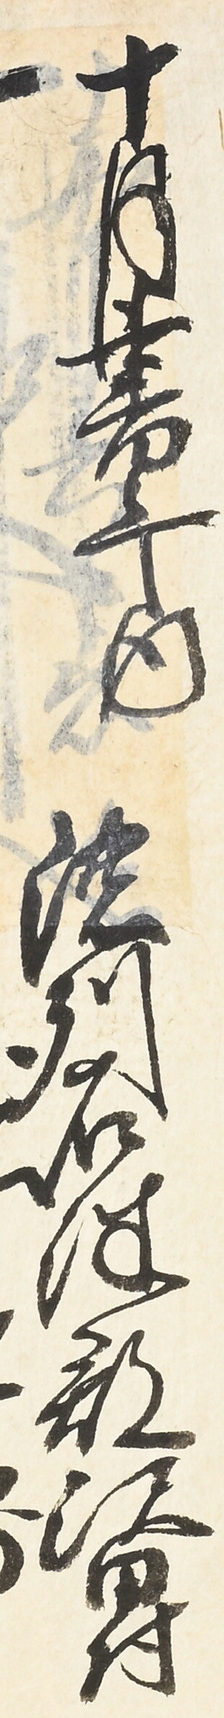十月書上之内濃州石津郡沢田村
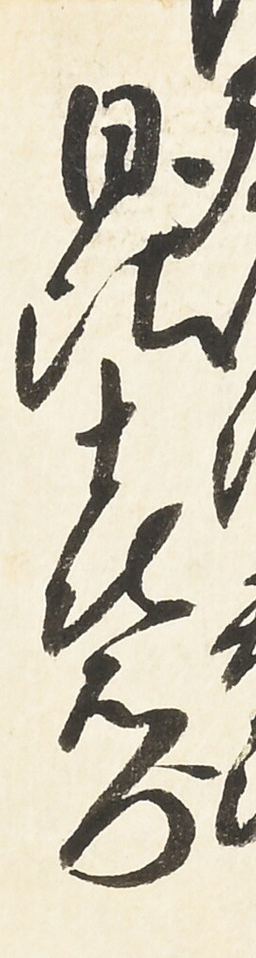日比喜右衛門
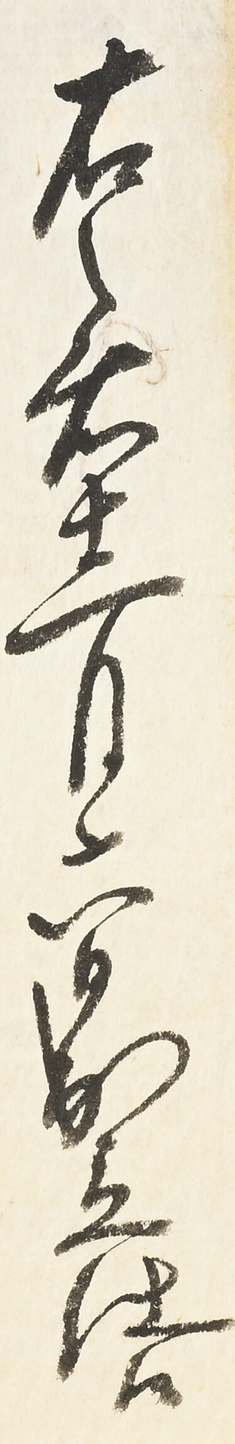右之者十二月六日出立仕候
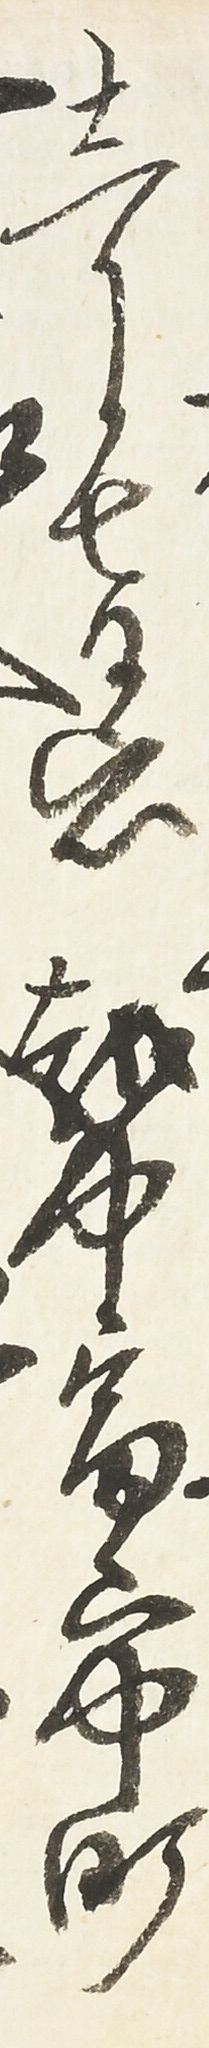十二月七日着越中冨山中町
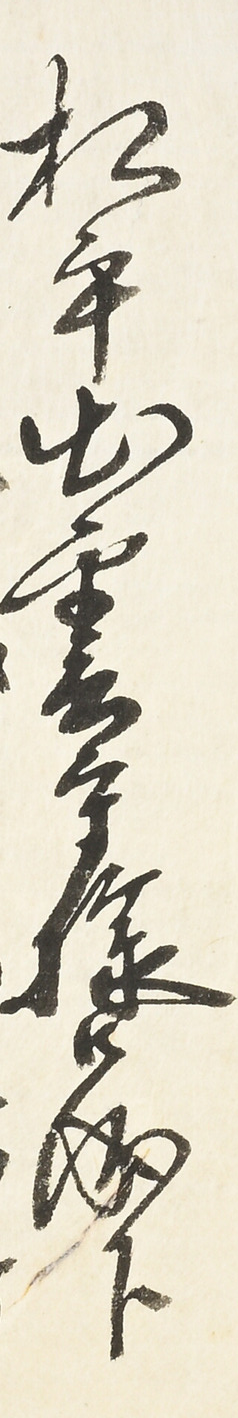松平出雲守様御城下
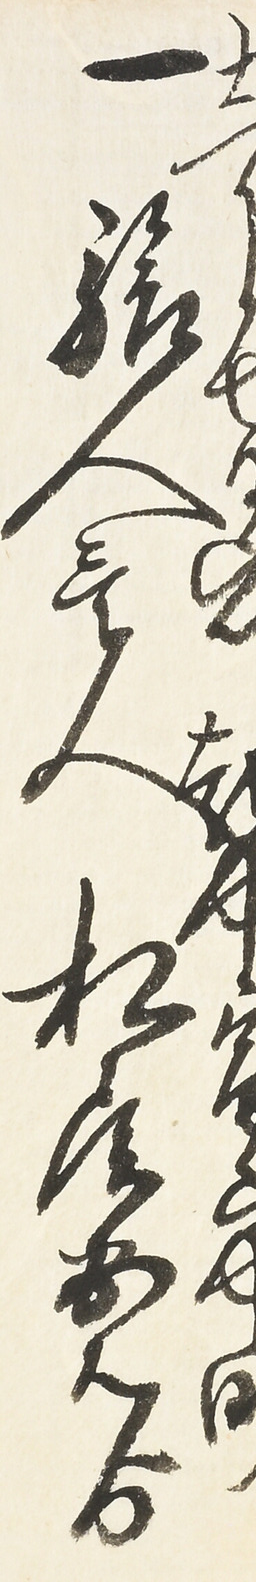一旅人壱人松屋安右衛門
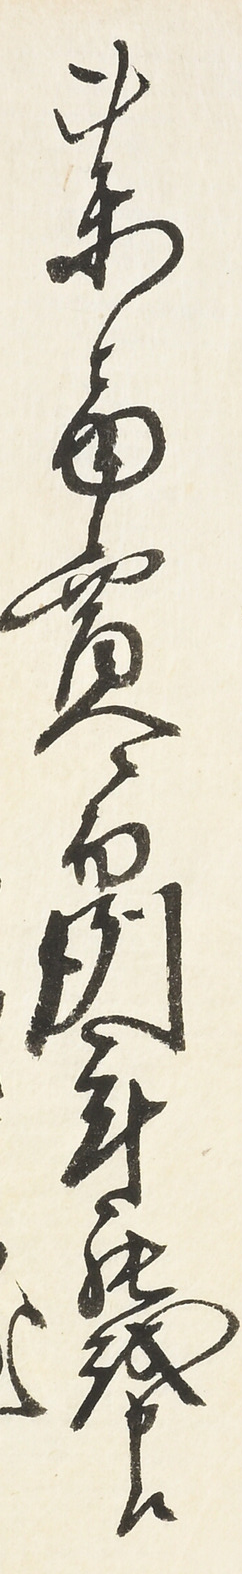薬商売ニ而例年罷越申候
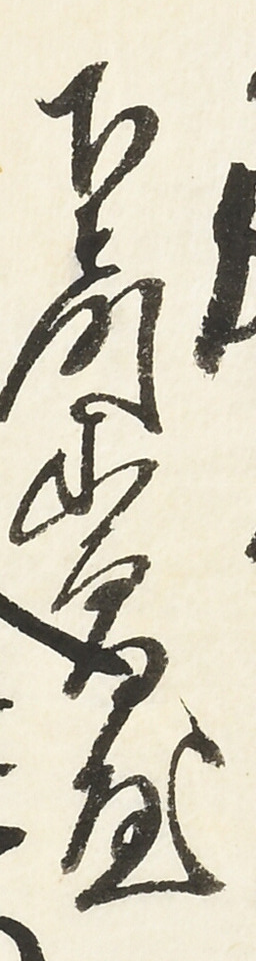下モ町木曽屋
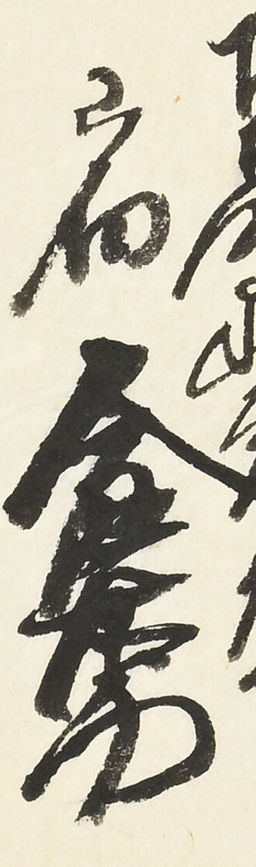宿金右衛門
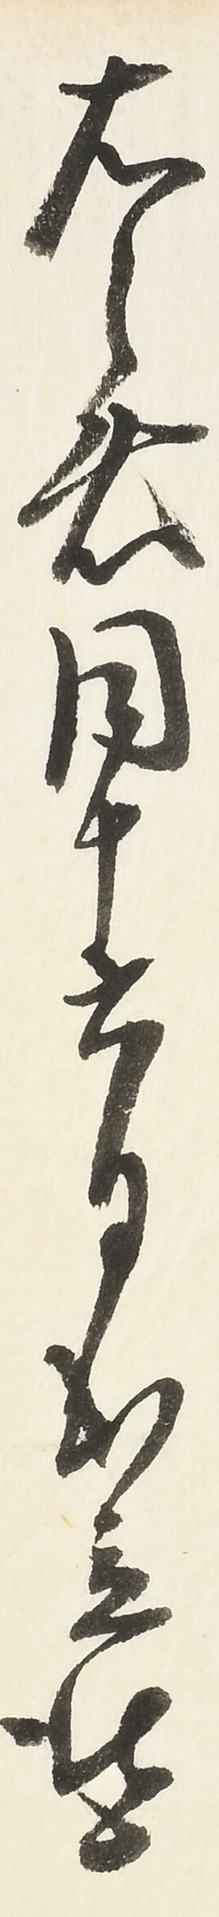右之者同十六日出立仕候
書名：町中旅人泊控帳
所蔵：伊那市立高遠町図書館・合同会社AMANE
